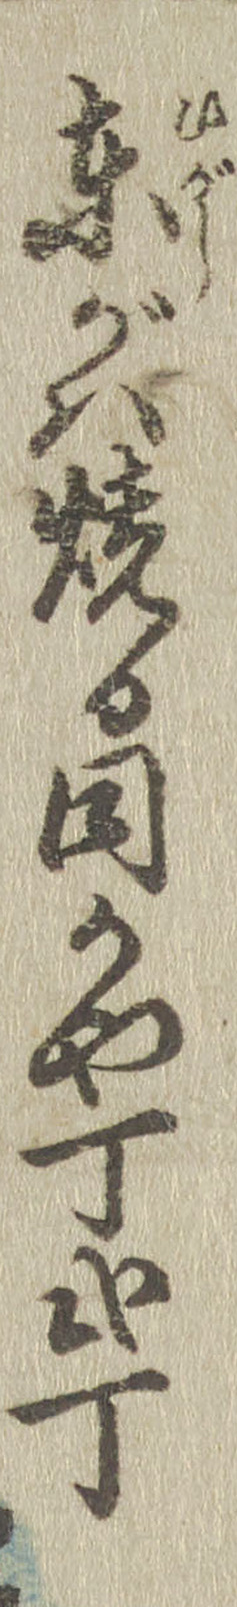東がハ焼る同かや丁弐丁
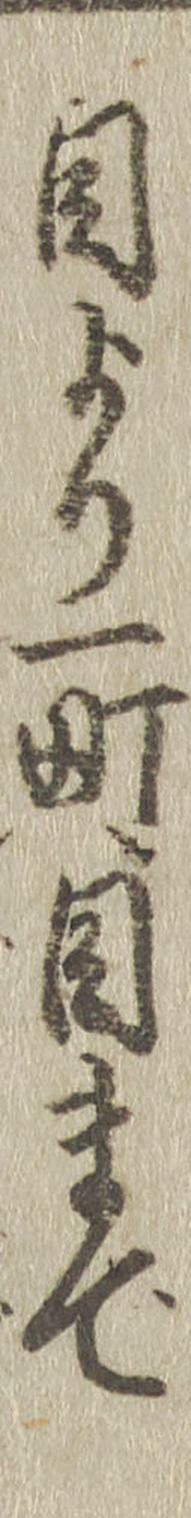目より一町目まで
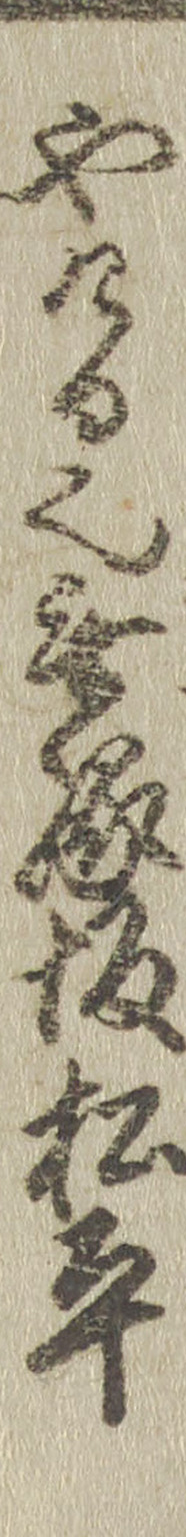やける也無縁坂松平
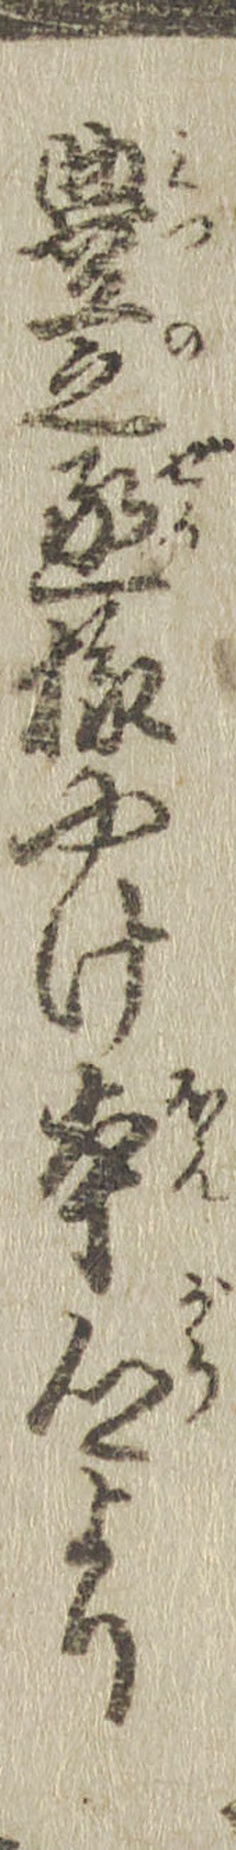豊之丞様やけ本郷より
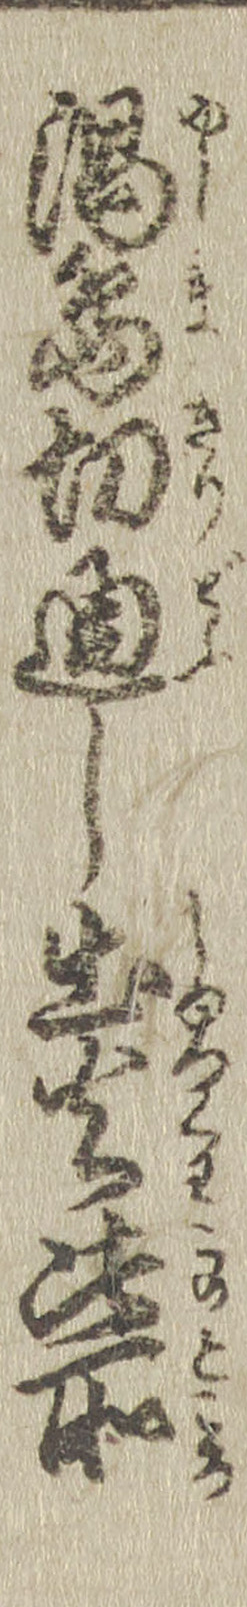湯島切通し出火此所
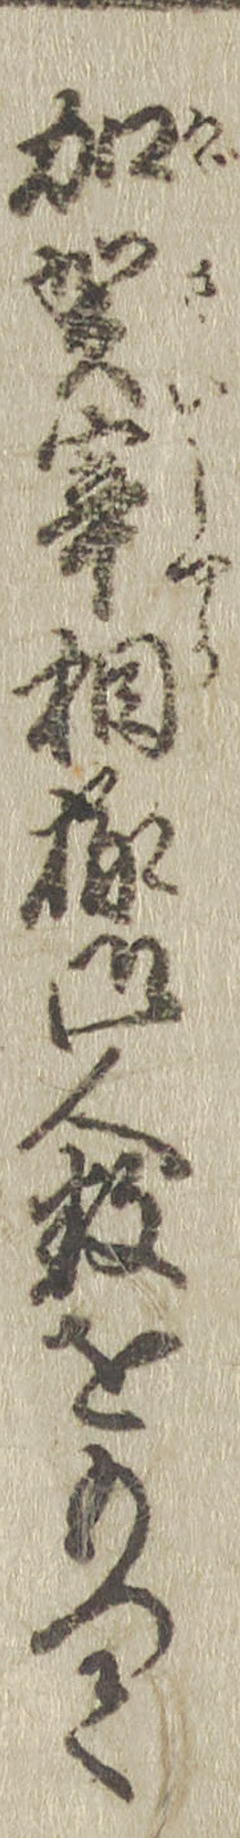加賀宰相様御人数をもつて
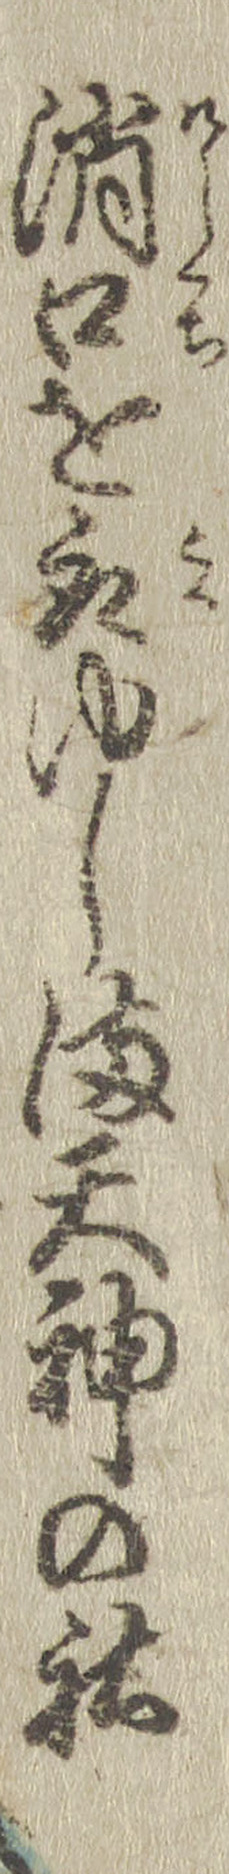消口を取ゆしま天神の社
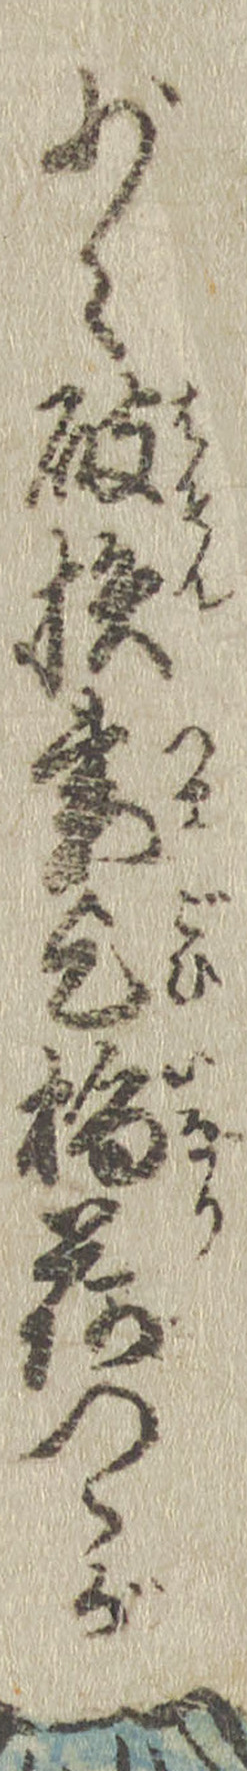少〻破損妻乞稲荷つゝが
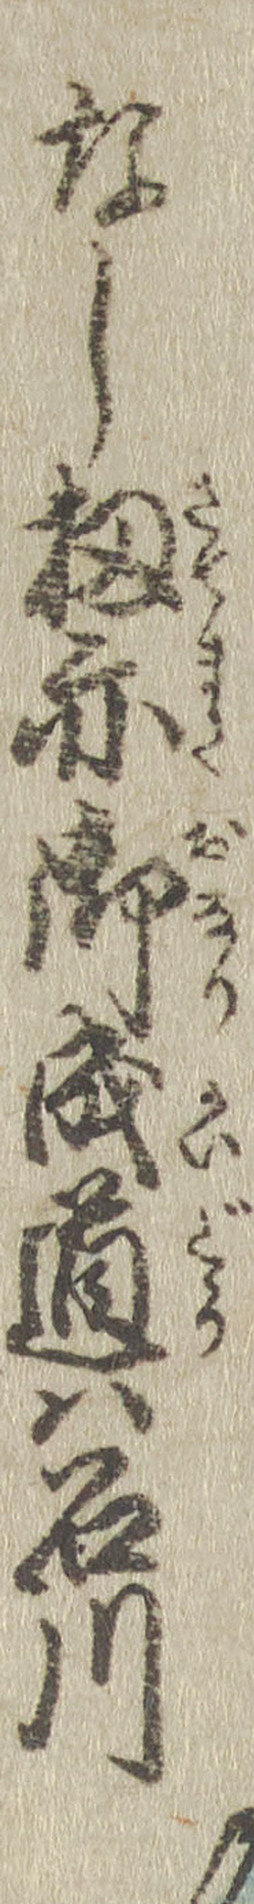なし扨亦御成道ハ石川
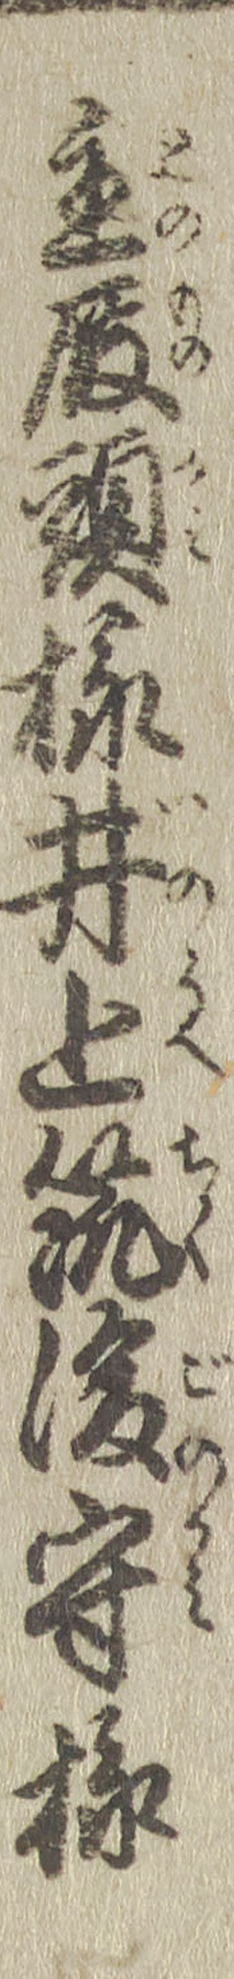主殿頭様井上筑後守様
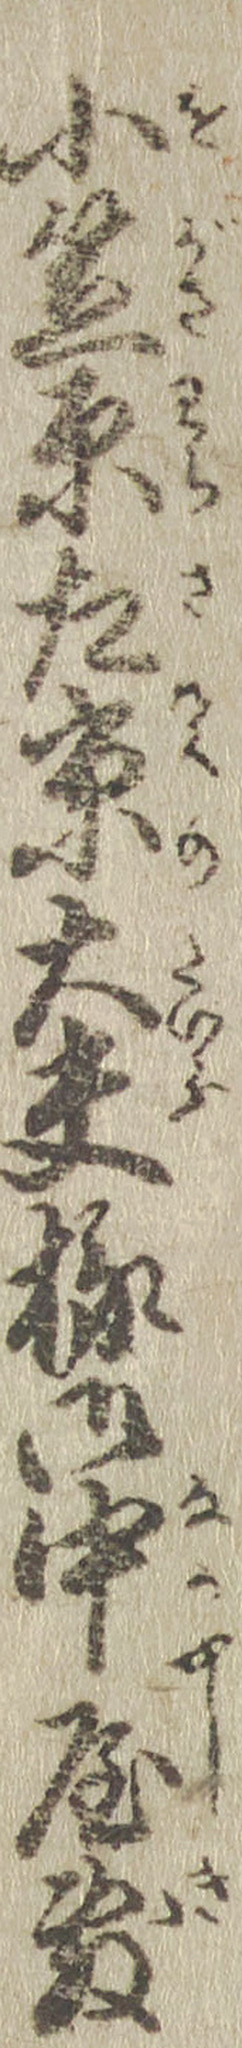小笠原左京大夫様御中屋敷
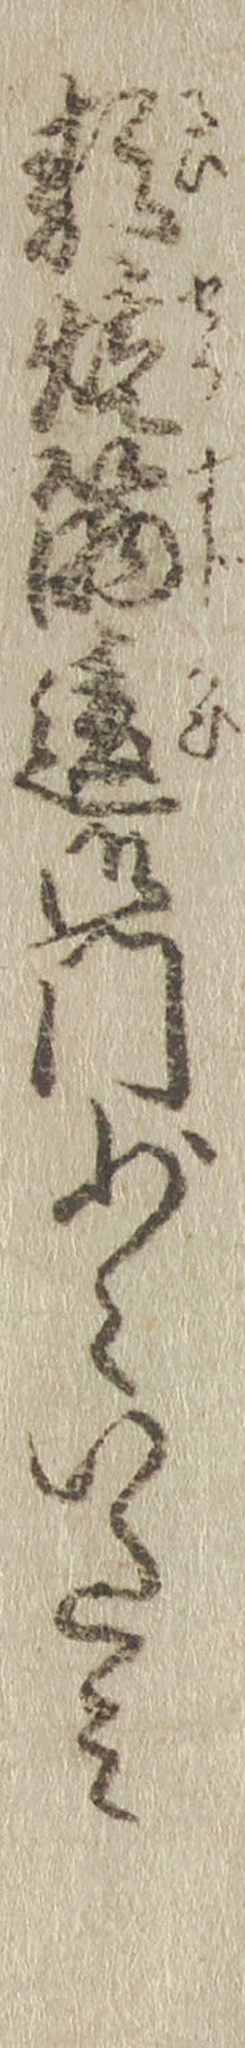類焼筋違御門少〻いたミ
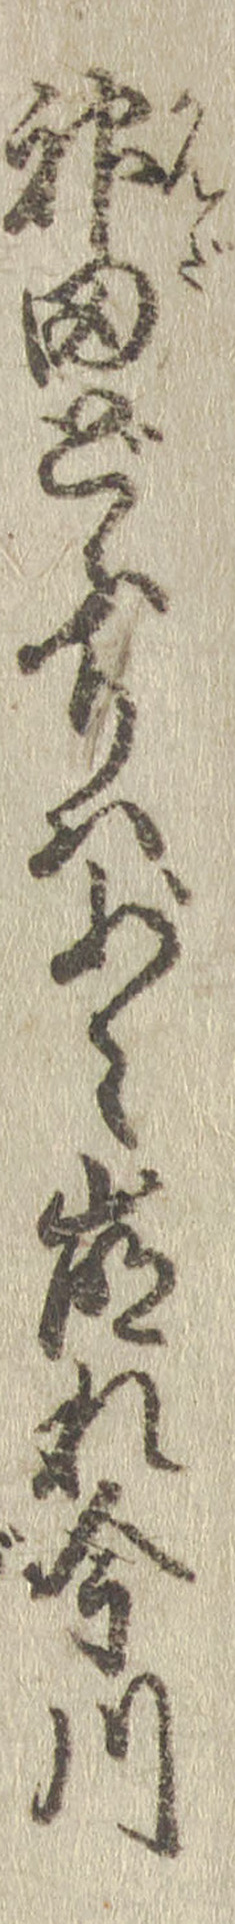神田どふりハ少〻崩れ今川
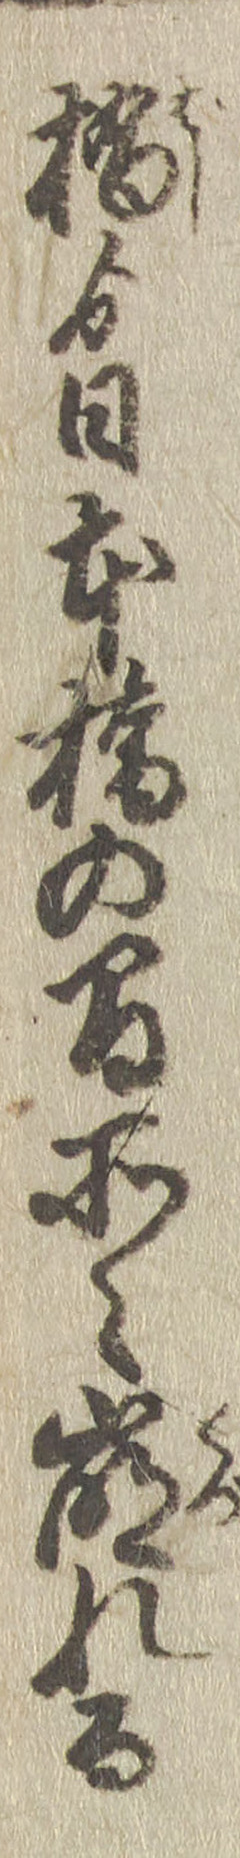橋ゟ日本橋の間所〻崩れる
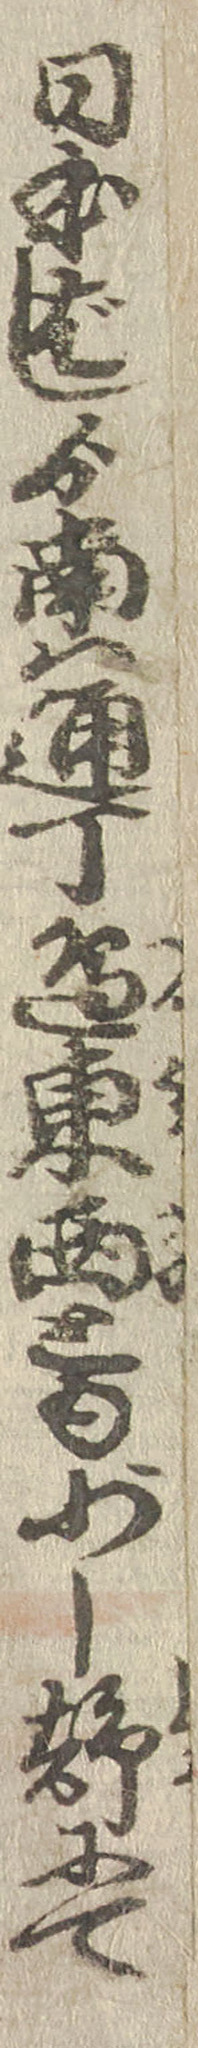日本ばしゟ南ハ通丁邊東西とも少し静にて
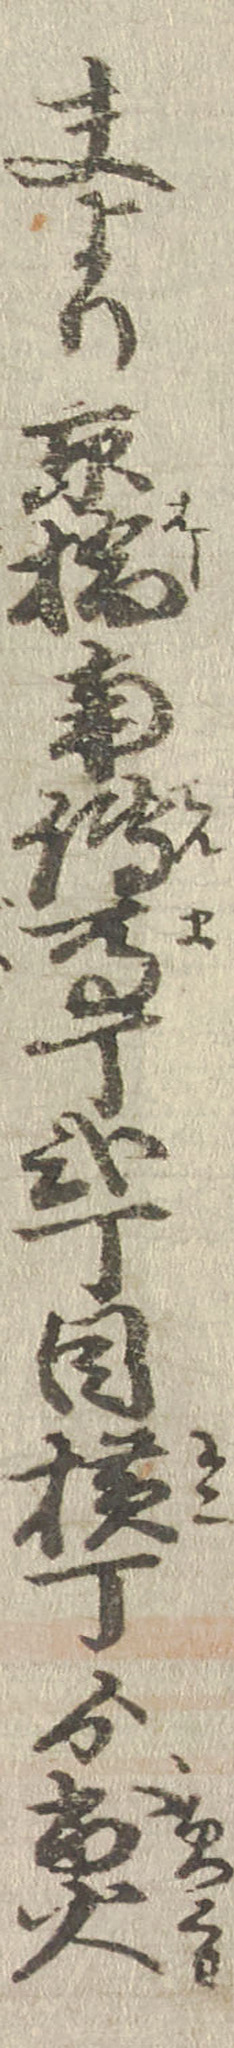夫より京橋南傳馬丁弐丁目横丁ゟ出火
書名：ゆるがぬ御代要之石寿栄
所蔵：東京大学総合図書館 General Library in the University of Tokyo, JAPAN
